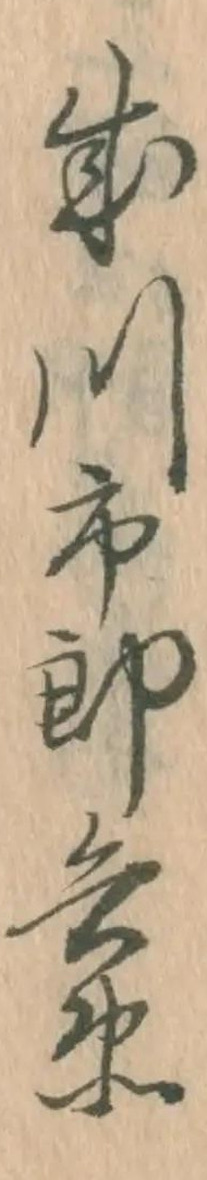成川市郎兵衛
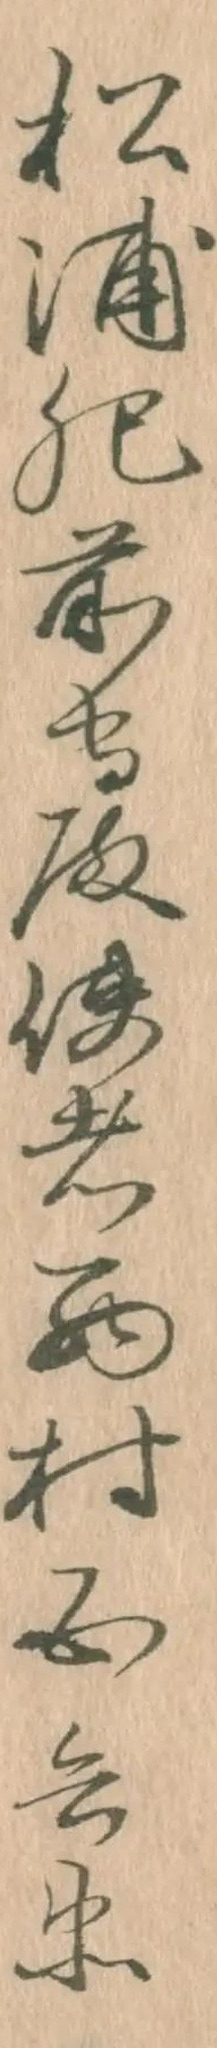松浦肥前守殿使者西村五兵衛
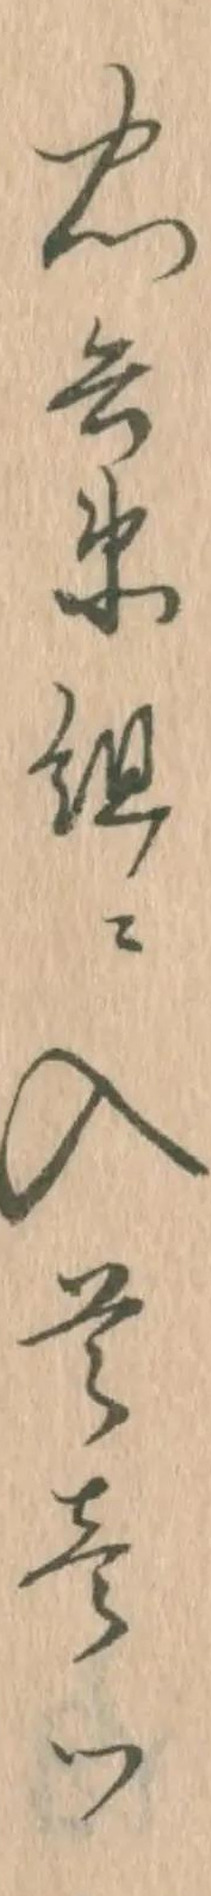忠兵衛組に入首壱つ
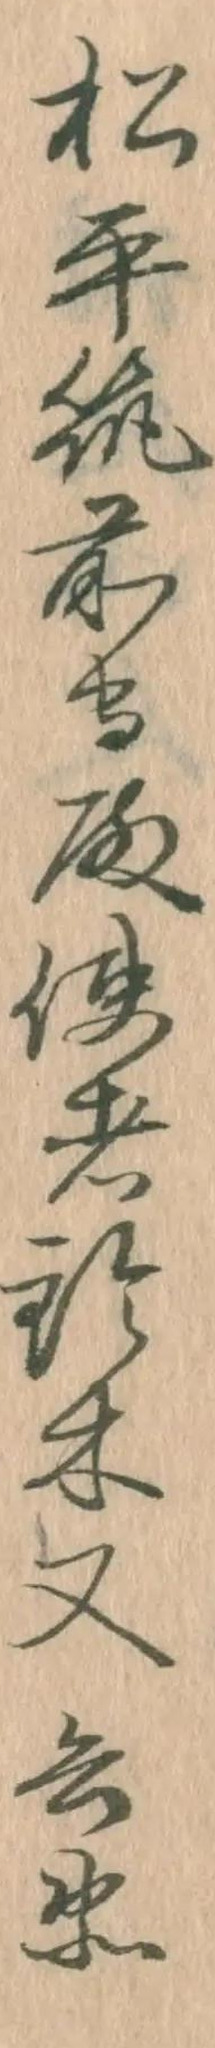松平筑前守殿使者鈴木又兵衛
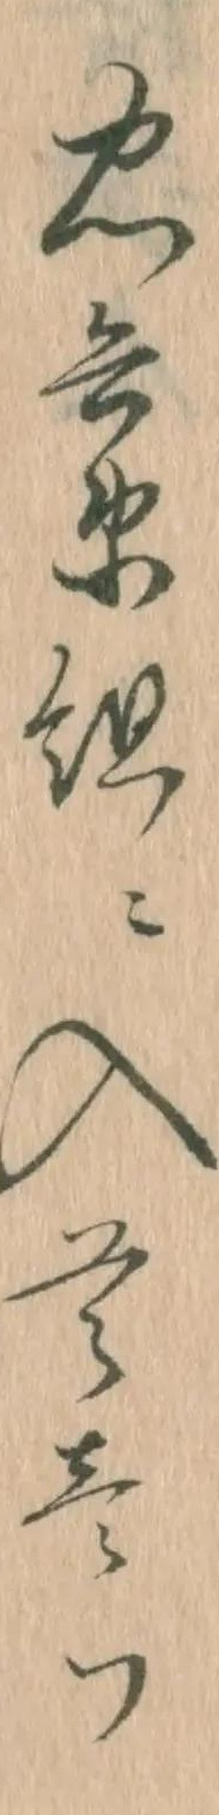忠兵衛組に入首壱つ
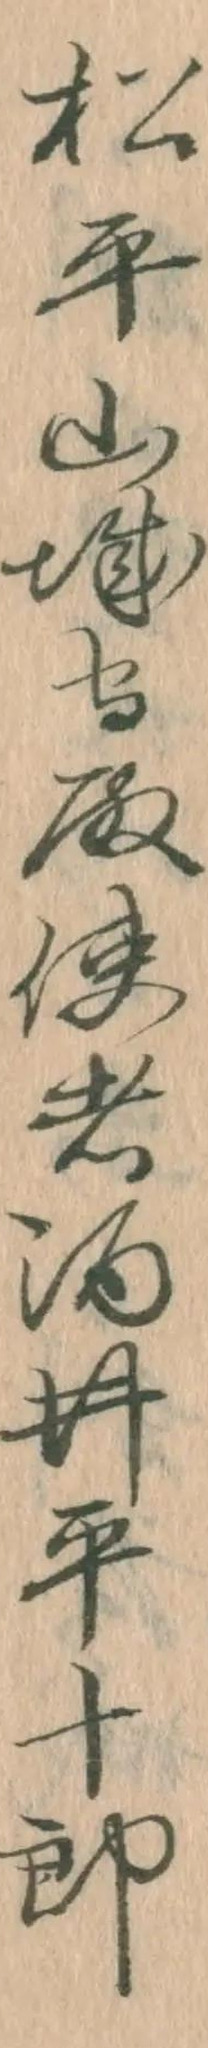松平山城守殿使者酒井平十郎
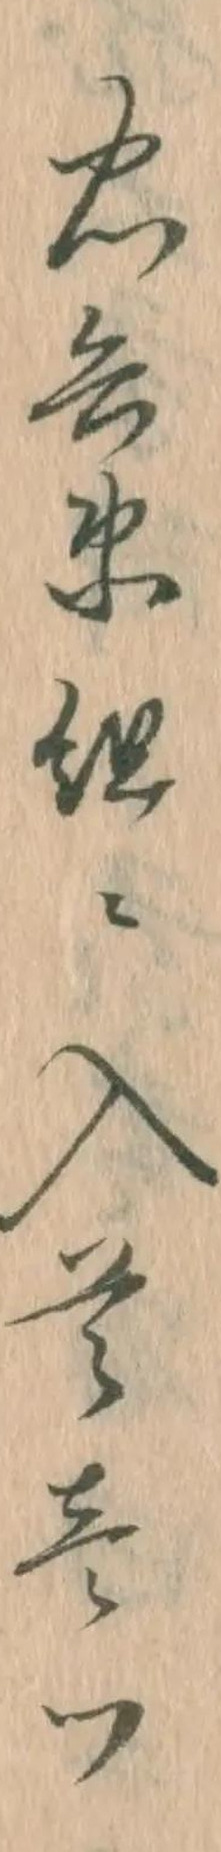忠兵衛組に入首壱つ
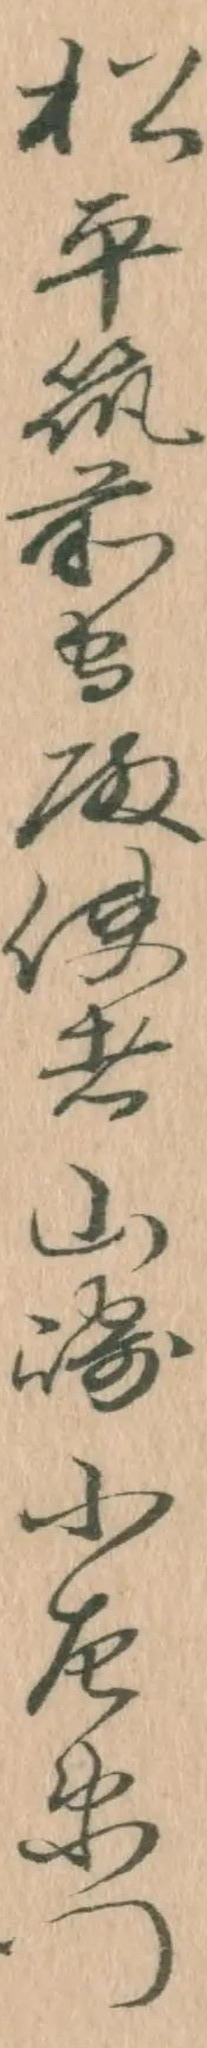松平筑前守殿使者山崎小左衛門
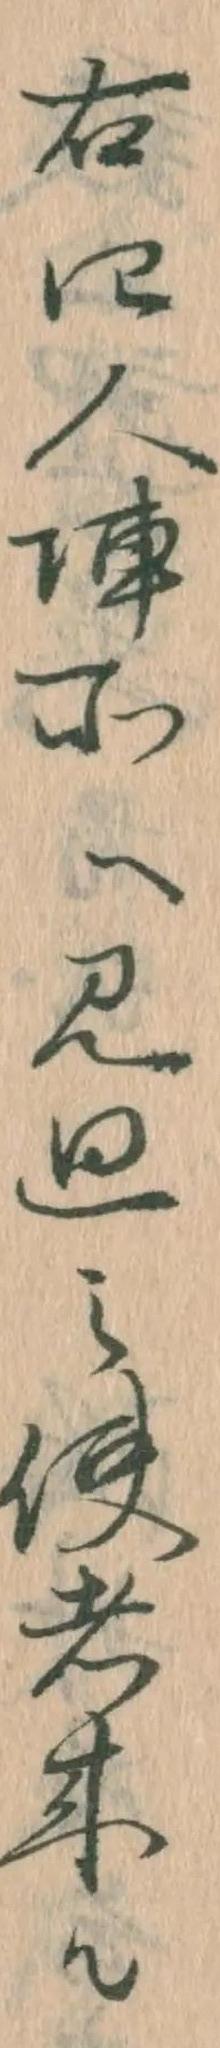右四人陣所へ見廻之使者来る
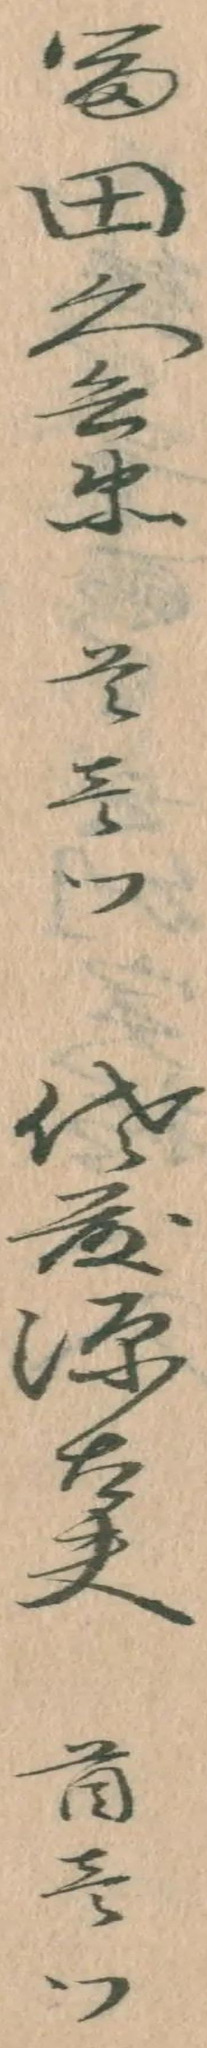冨田久兵衛首壱つ佐藤源太夫首壱つ
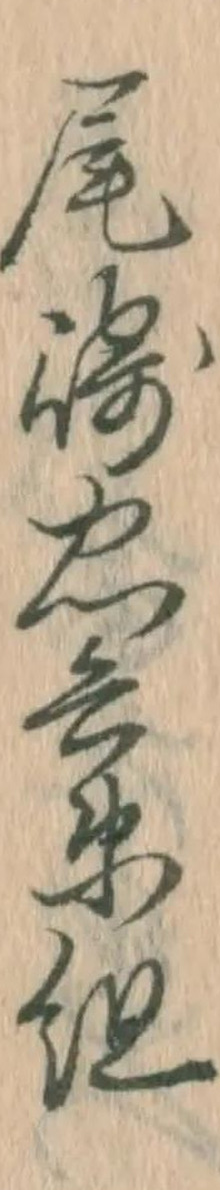尾崎忠兵衛組
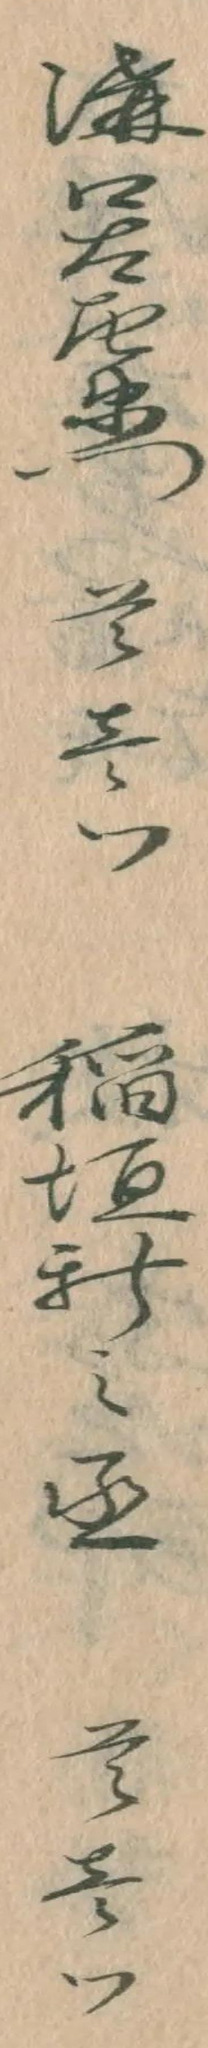溝口太左衛門首壱つ稲垣新之丞首壱つ
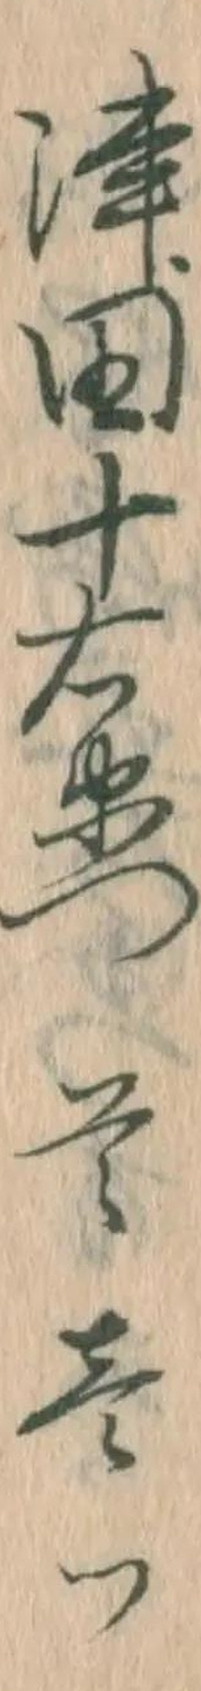津田十右衛門首壱つ
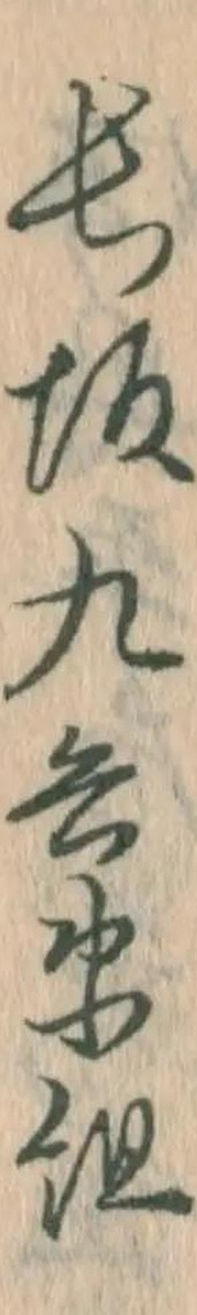長坂九兵衛組
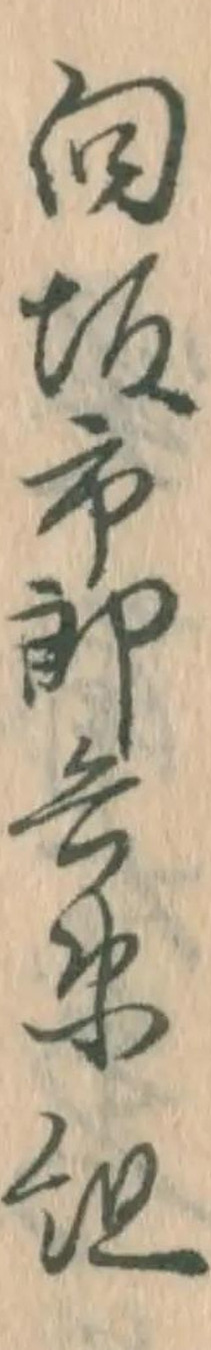向坂市郎兵衛組

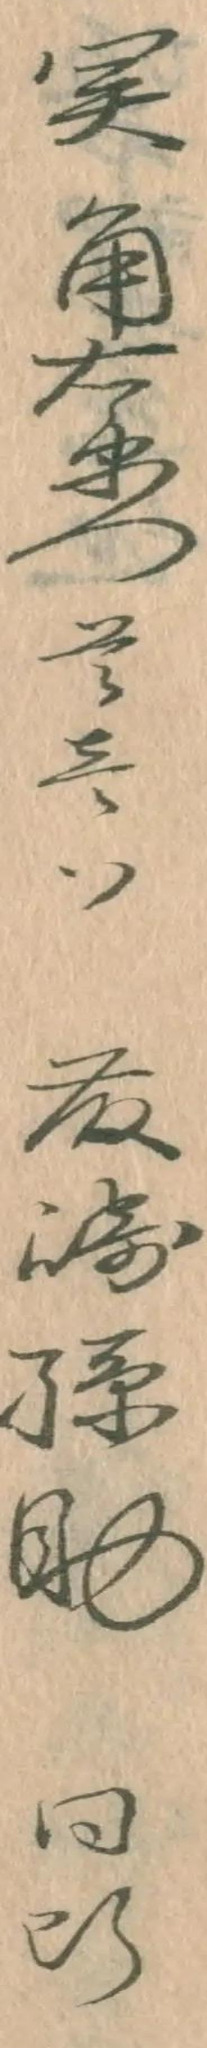関角右衛門首壱つ藤崎孫助同断
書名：切支丹御退治記 49巻. [9]
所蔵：国立国会図書館 National Diet Library, JAPAN
